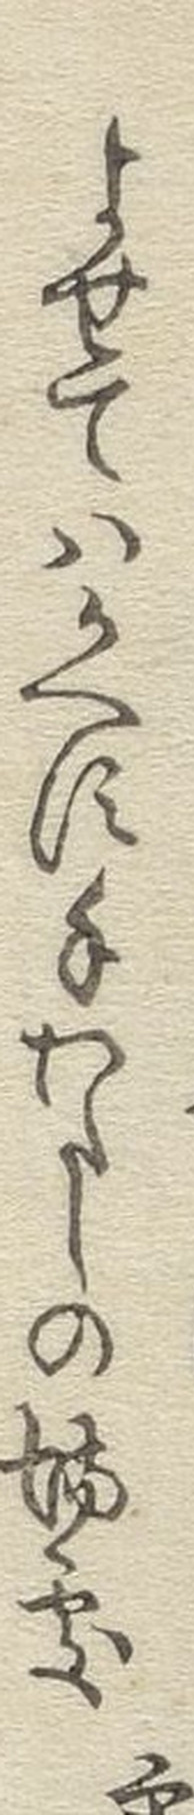よせてはかへす手わたしの場処実生
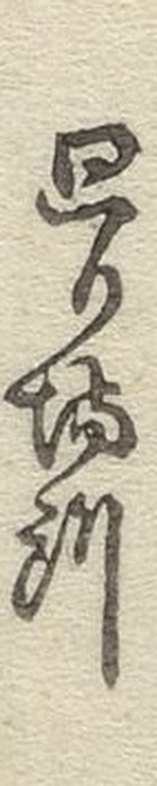廻り場所
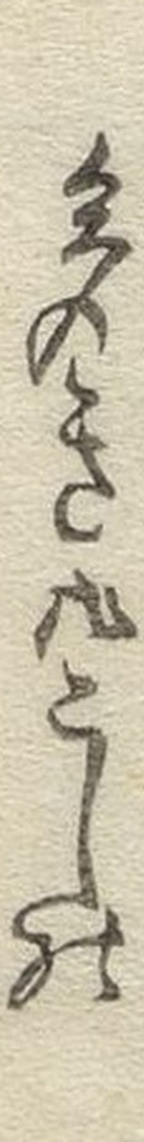多き御こしの
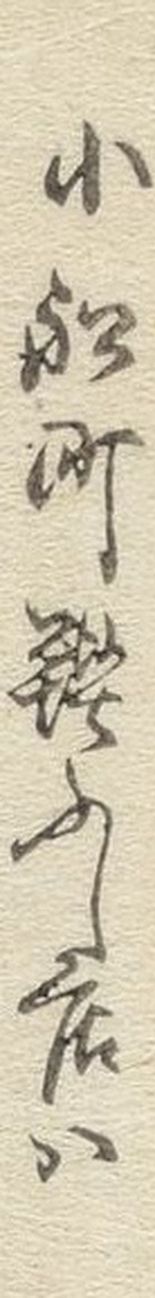小船町鰹ふし店は
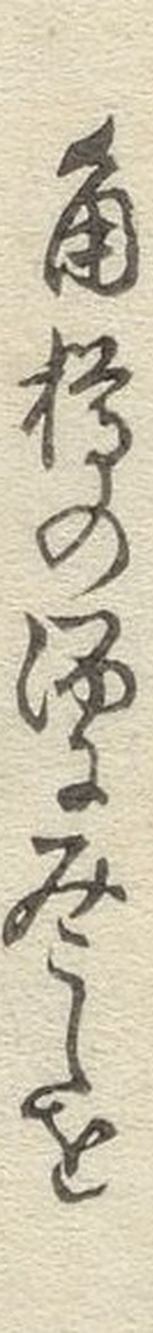角樽の酒にみこしを
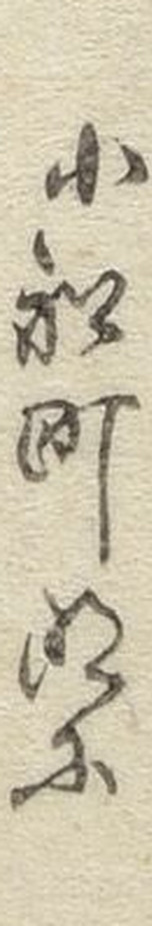小船町明に
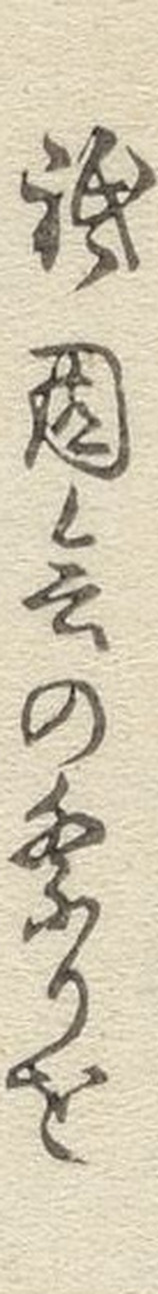祇園会の祭りを
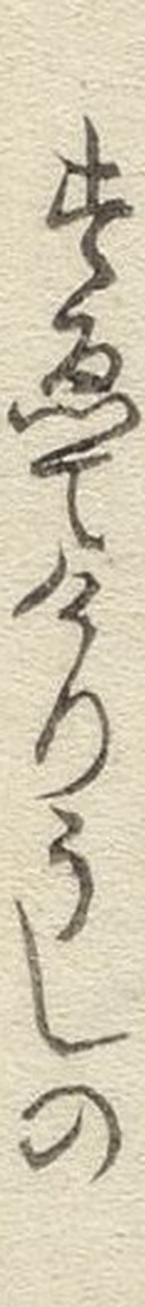すえてけりうしの
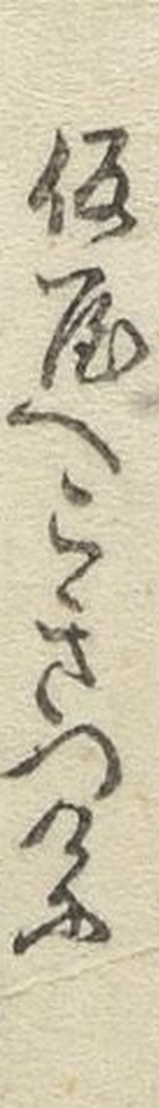仮屋へこきつけに
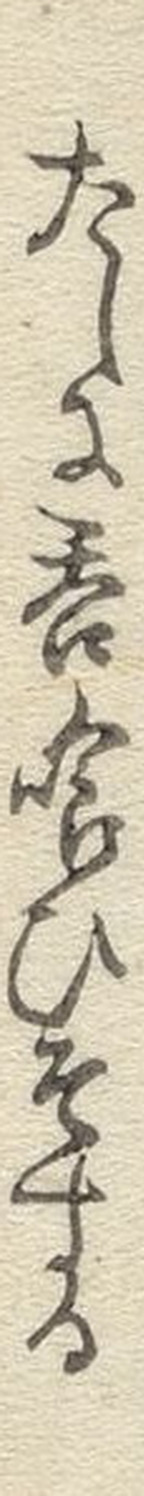たしに呑喰ひそする
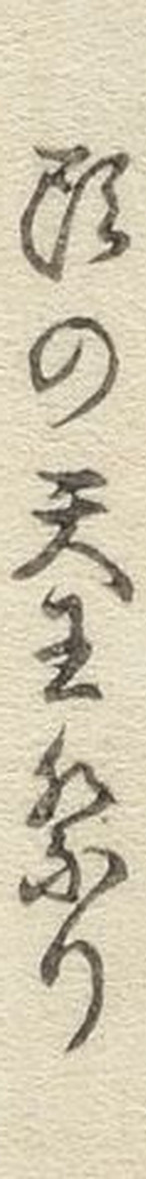頭の天王祭り
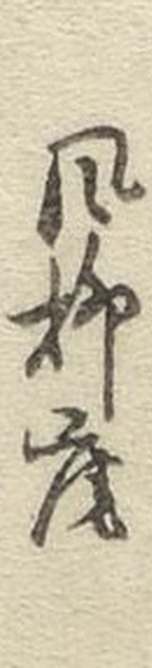風柳庵
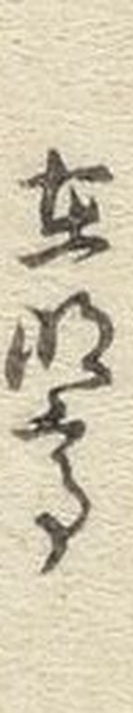在明亭
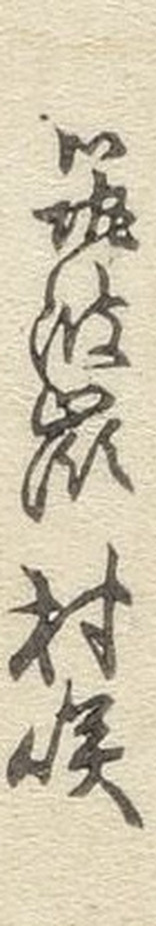筑波嶺村咲
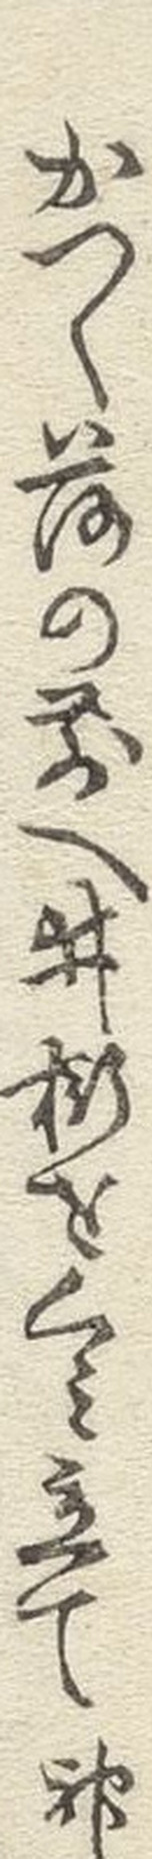かつく荷の前へ井桁をくみ立て神風や
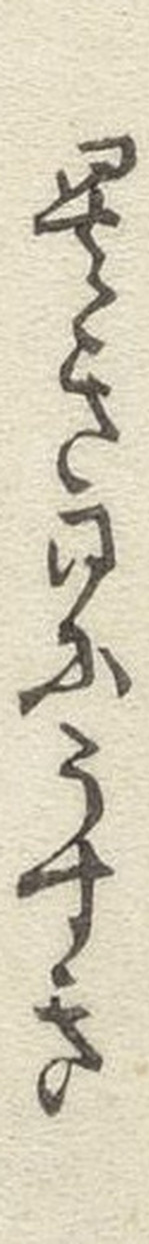暑き日にうすき
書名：Picture Album of People with Kyōka (Light Verse) (Kyōka shiki jinbutsu 狂歌四季人物)
